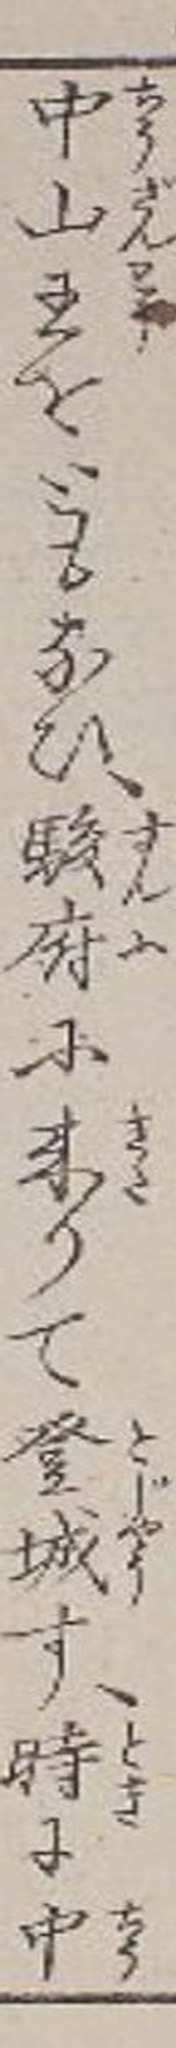中山王をともなひ、駿府に来りて登城す、時に中
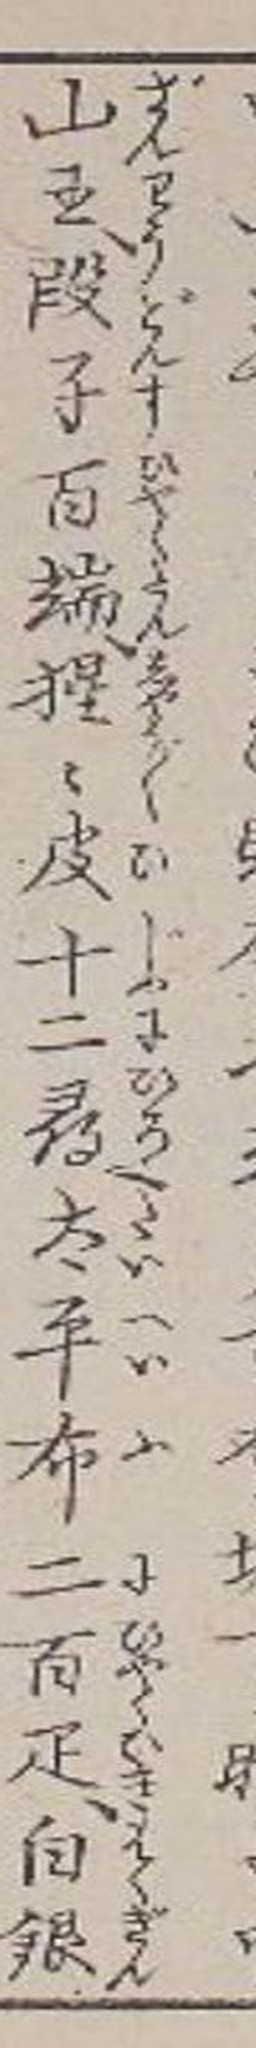山王、段子百端、猩々皮十二尋、太平布二百疋、白銀
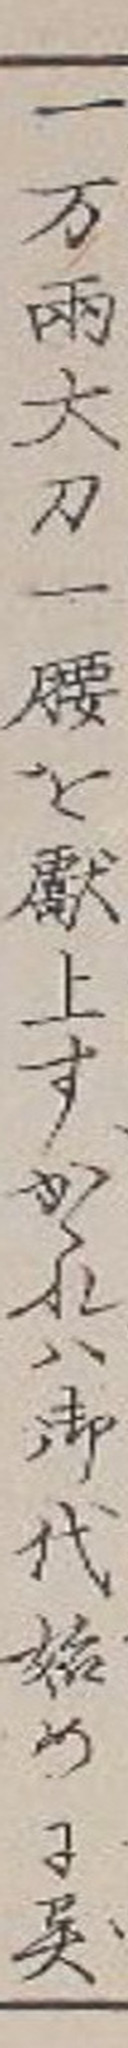一万両、大刀一腰を献上す、かゝれば御代始めに異
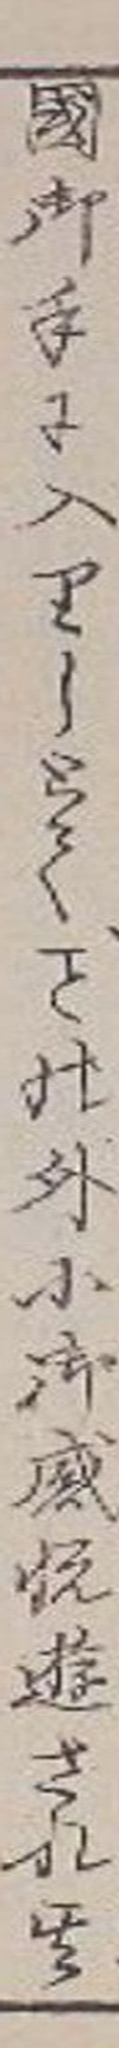国御手に入りしとて、ことの外に御感悦遊され、其
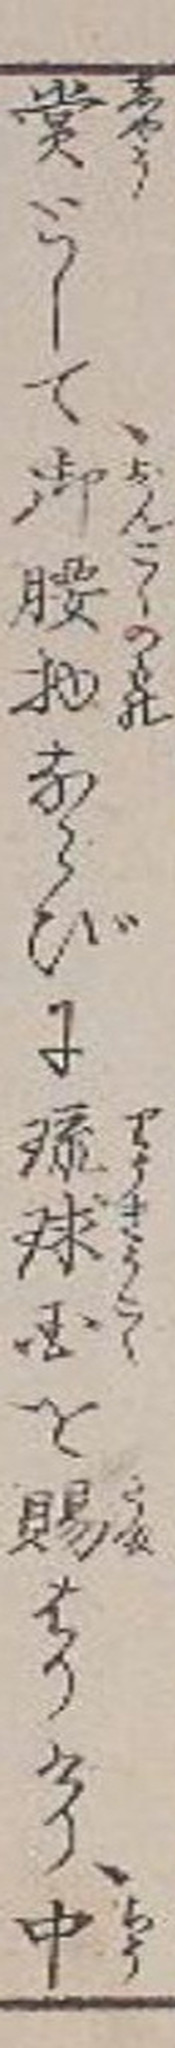賞として、御腰物ならびに琉球国を賜はりけり、中
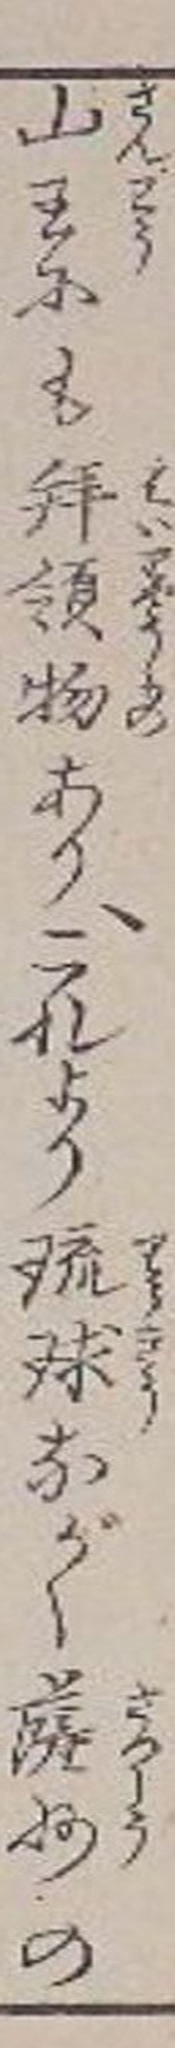山王にも拝領物あり、これより琉球ながく薩州の
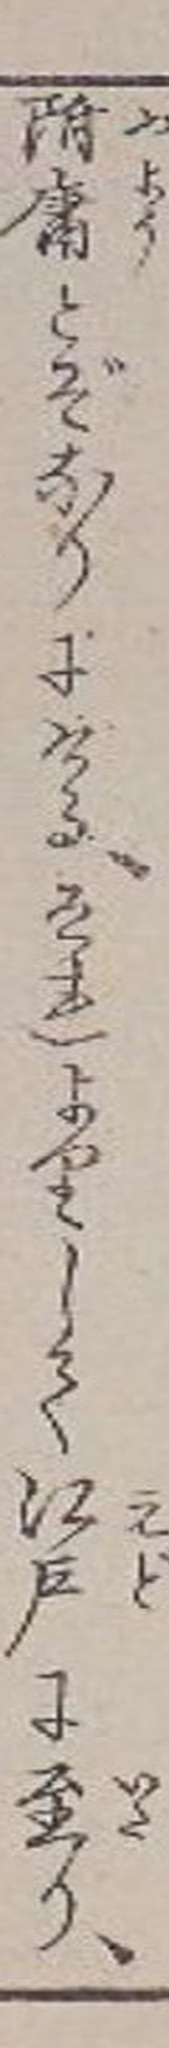附庸とぞなりにける、それよりして江戸に至り、
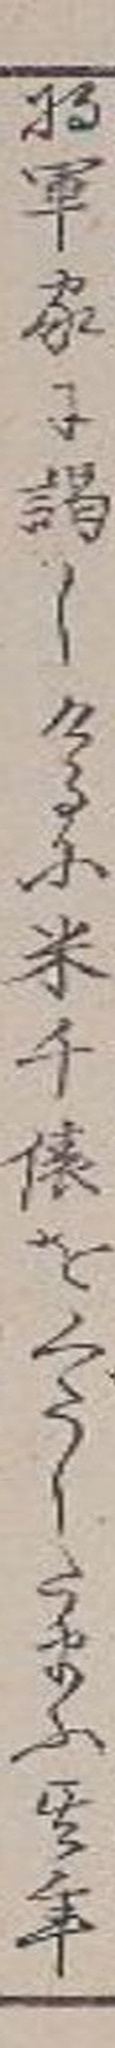将軍家に謁しけるに、米千俵をくだしたまふ、其年

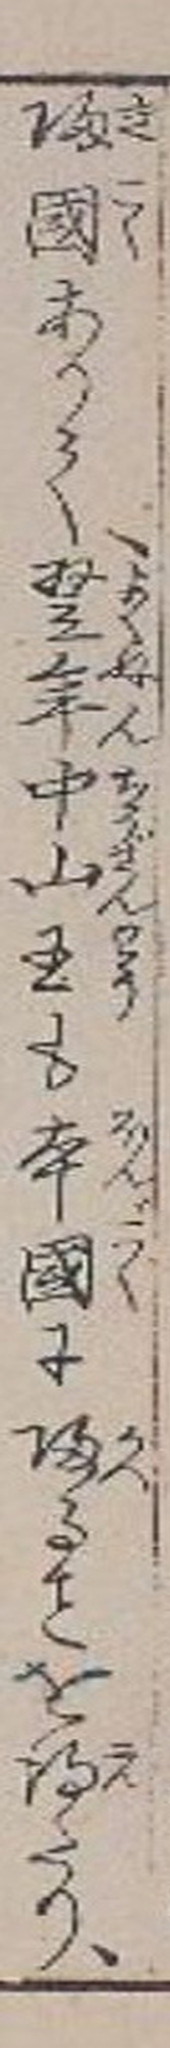帰国ありて、翌年中山王も本国に帰ることを得たり、
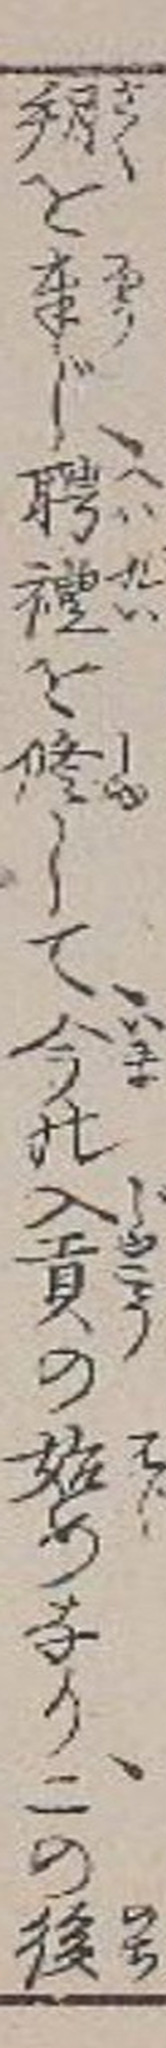朔を奉じ、聘礼を修して、今の入貢の始めなり、この後
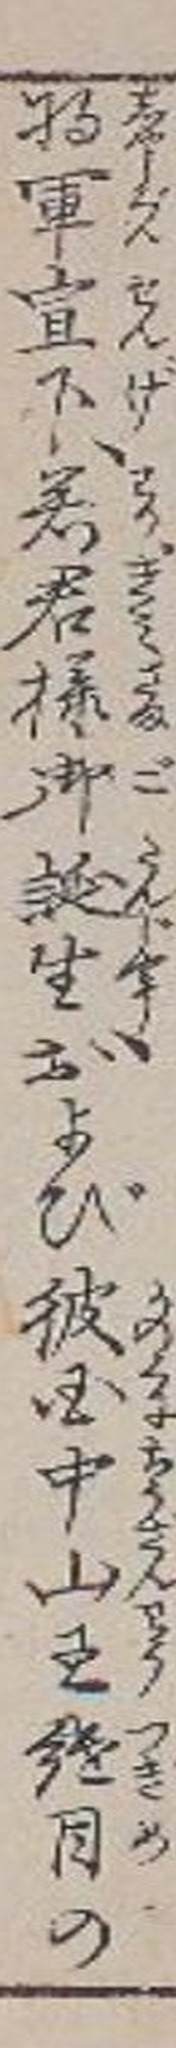将軍宣下、若君様御誕生、および彼国中山王継目の
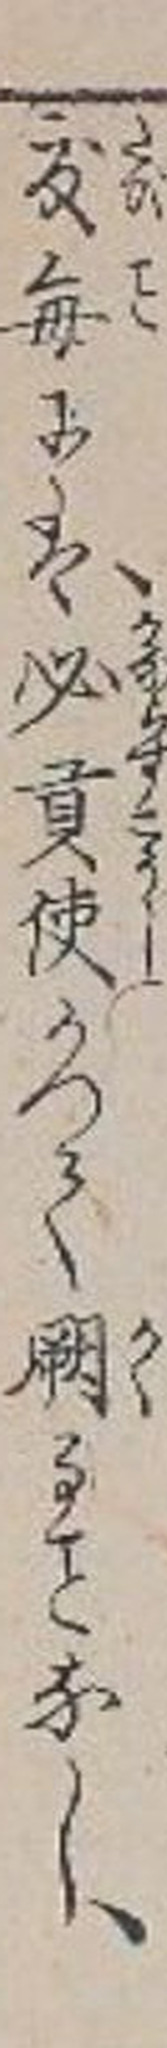度毎には、必貢使かつて闕ることなし、
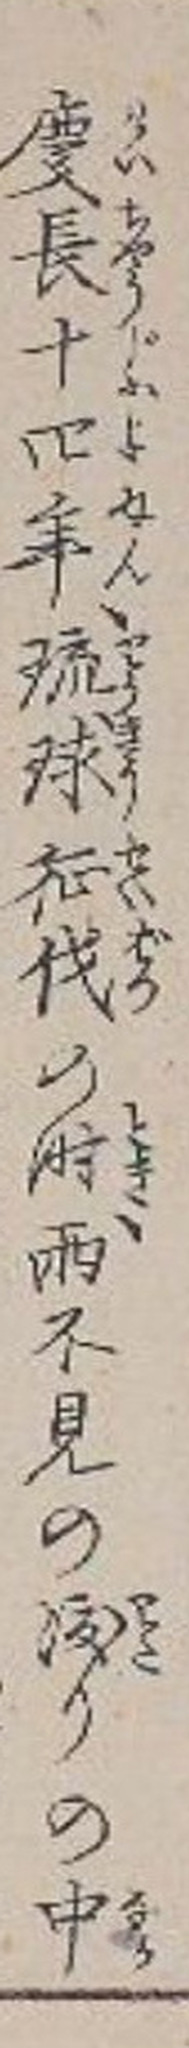慶長十四年、琉球征伐の時、雨不見の渡りの中
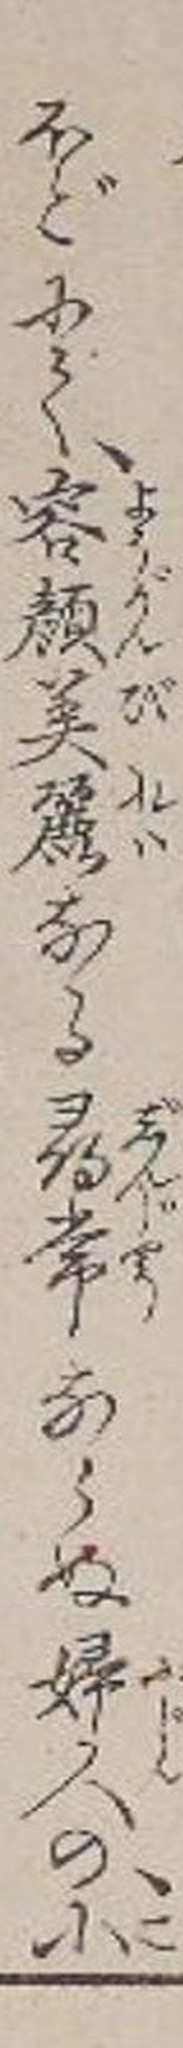ほどにて、容顔美麗なる尋常ならぬ婦人の、小
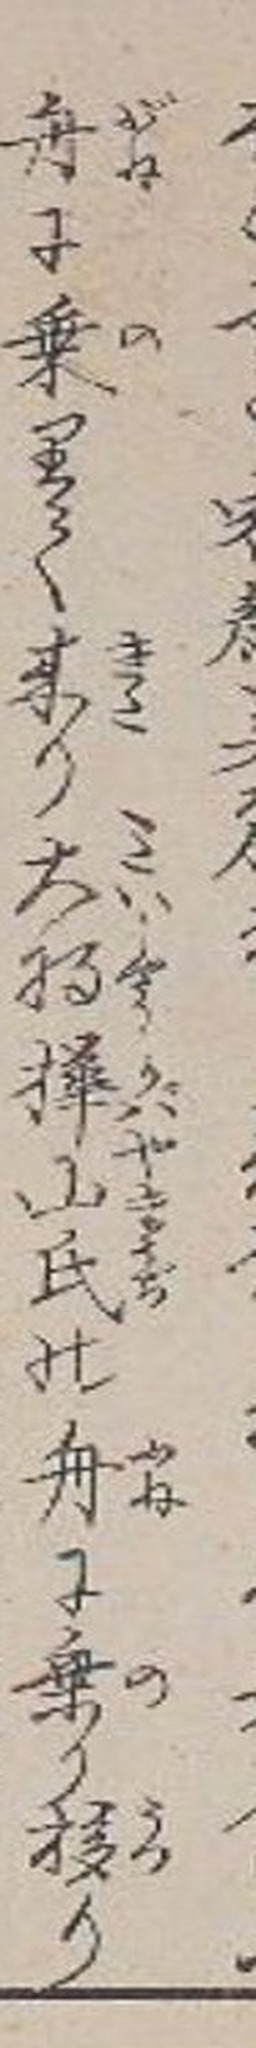舟に乗りて来り、大将樺山氏の舟に乗り移り
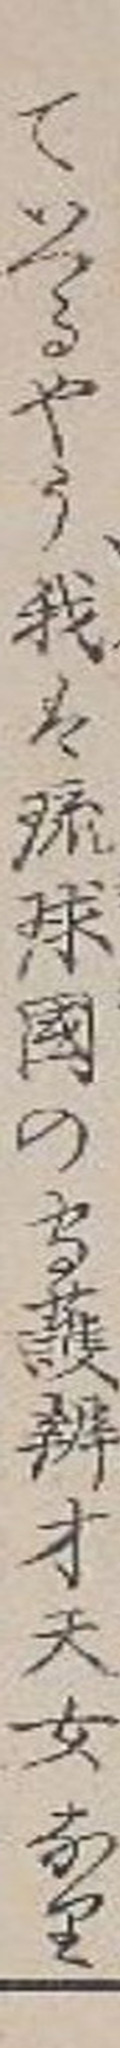ていへるやう、我は琉球国の守護弁才天女なり、
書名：琉球入貢紀略
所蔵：University of the Ryukyus Library
